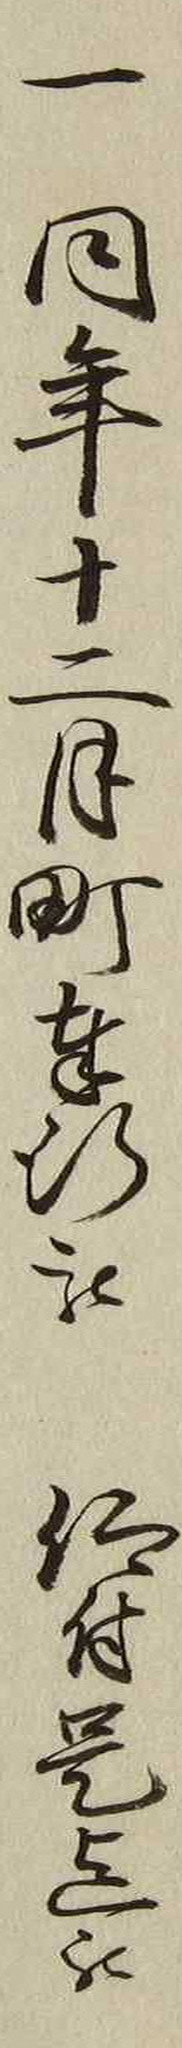一同年十二月町奉行被仰付是被
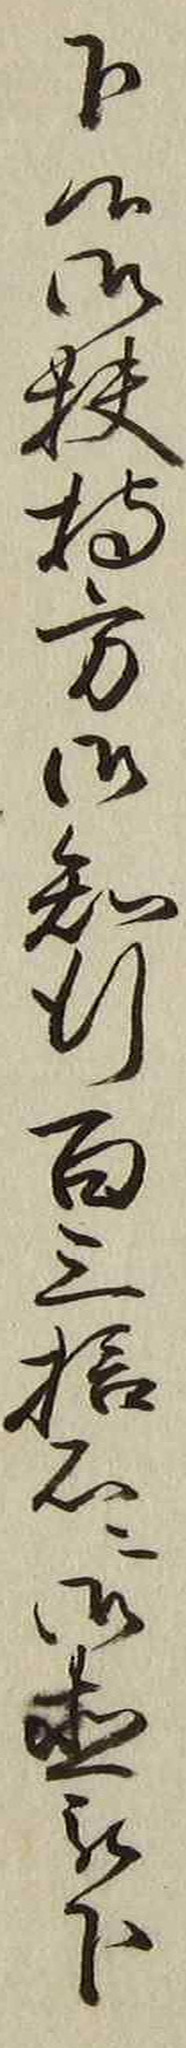下候御扶持方御知行百三拾ニ直被下
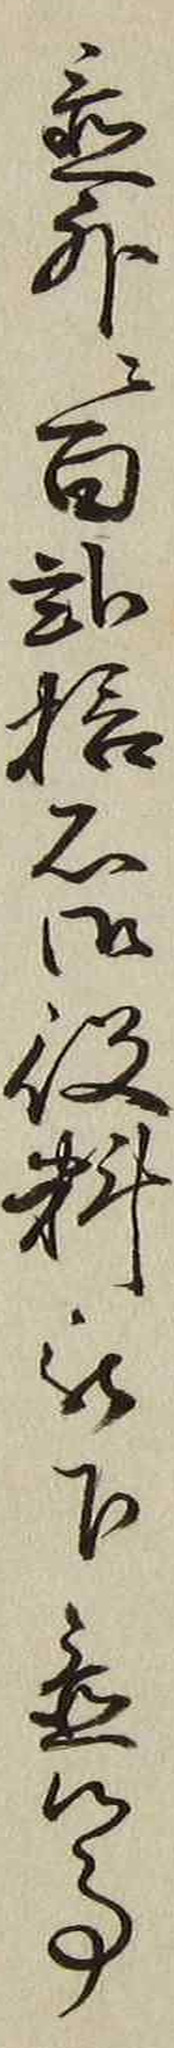置外ニ百弐拾石御役料被下置候事
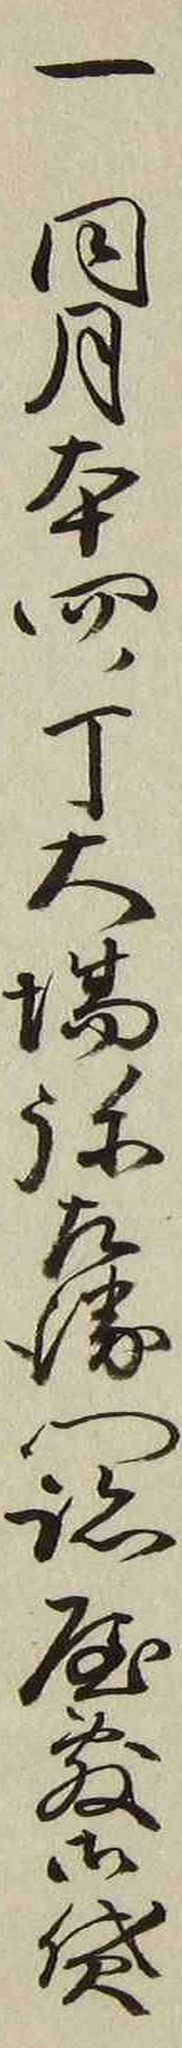一同月本問ノ丁大場弥左衛門跡屋敷御貸
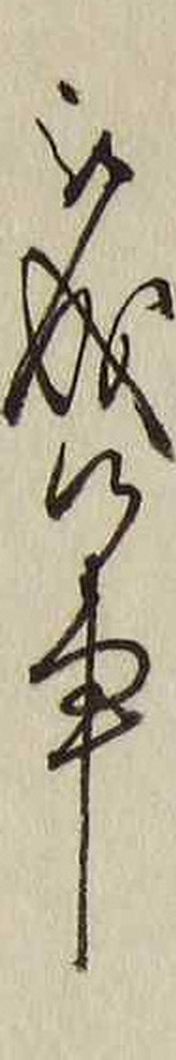被成候事
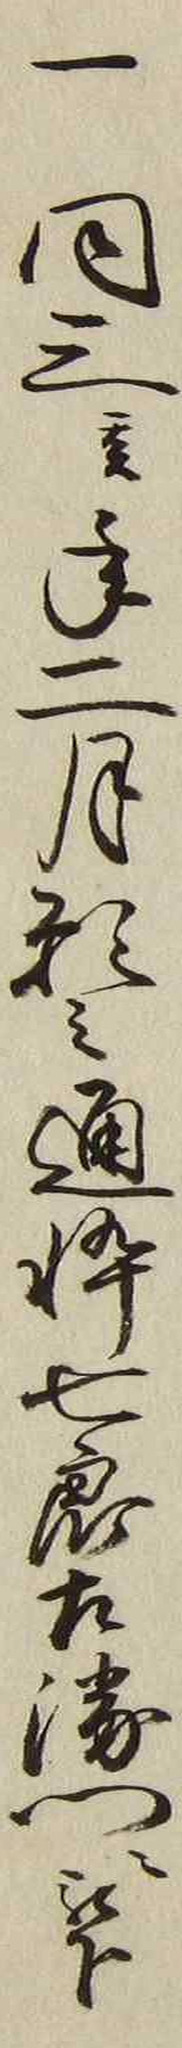一同三亥年二月願之通忰七郎左衛門ニ被下
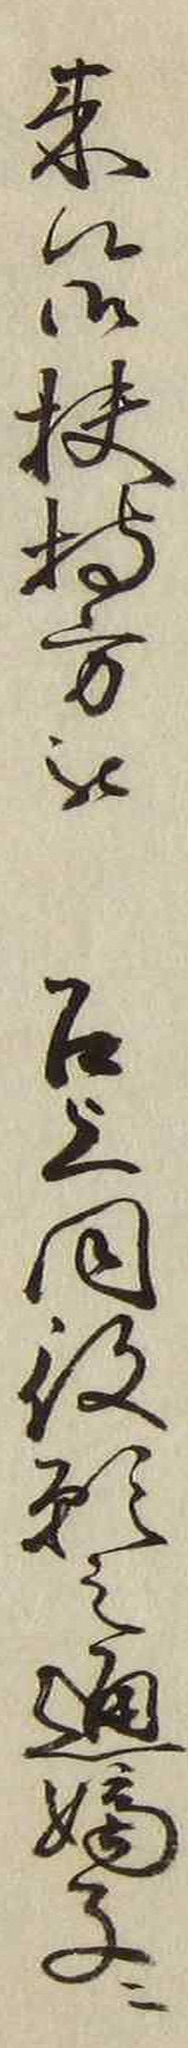来候御扶持方被召上同役願之通嫡子ニ

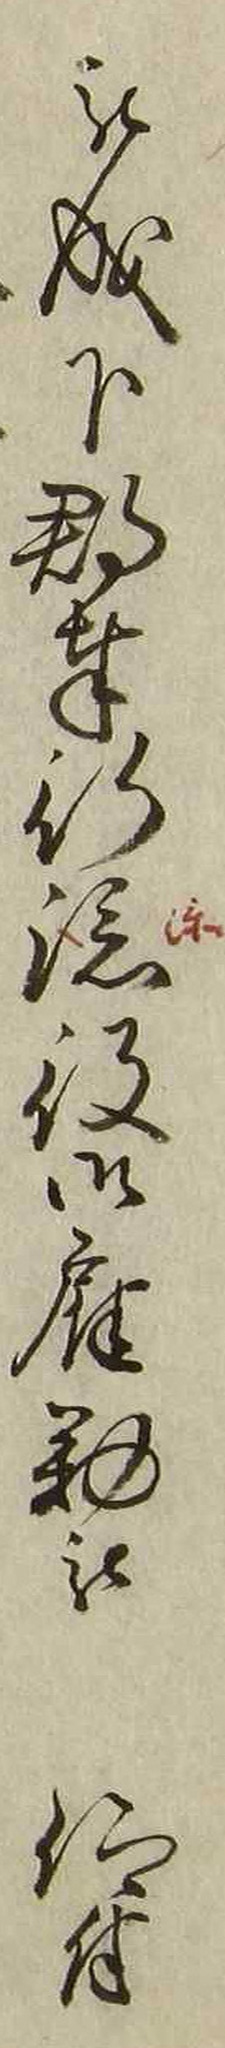被成下郡奉行添役御雇勤被仰付
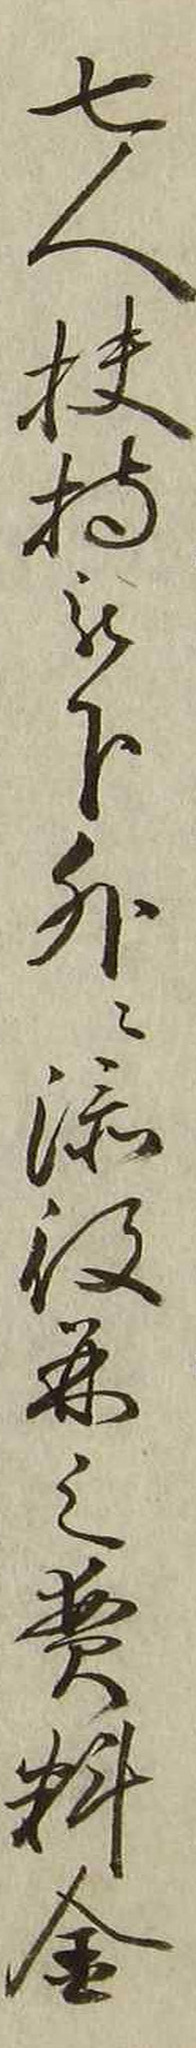七人扶持被下外ニ添役并之費料金
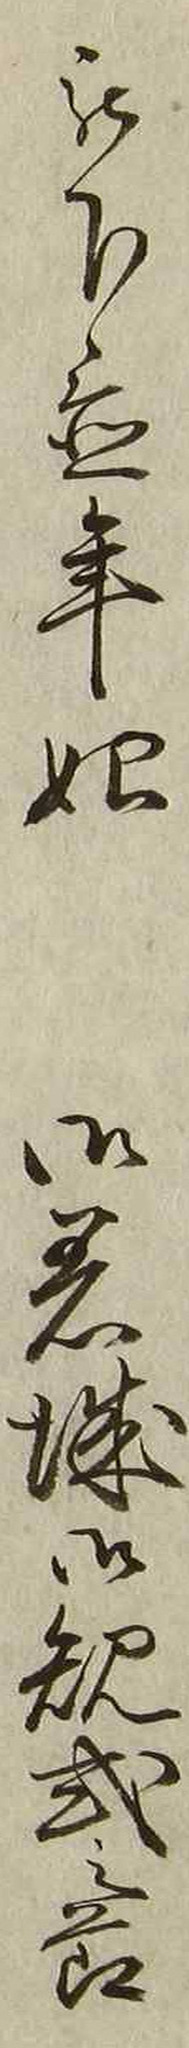被下置年始御着城御規式之節
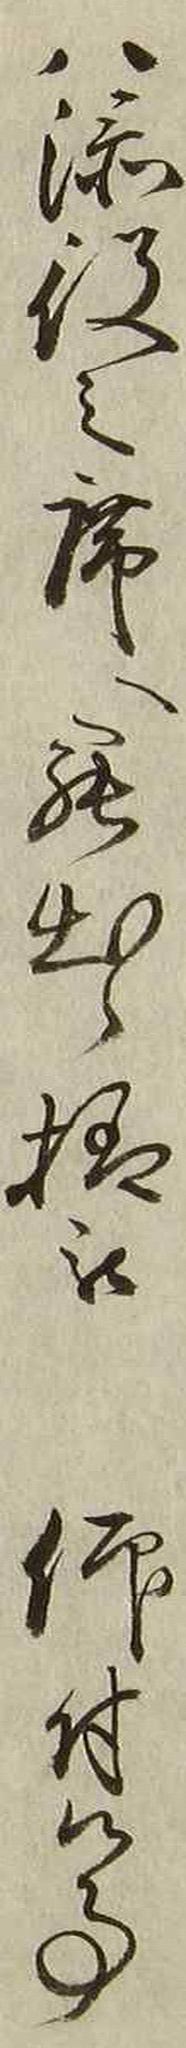ハ添役之席へ罷出候様被仰付候事
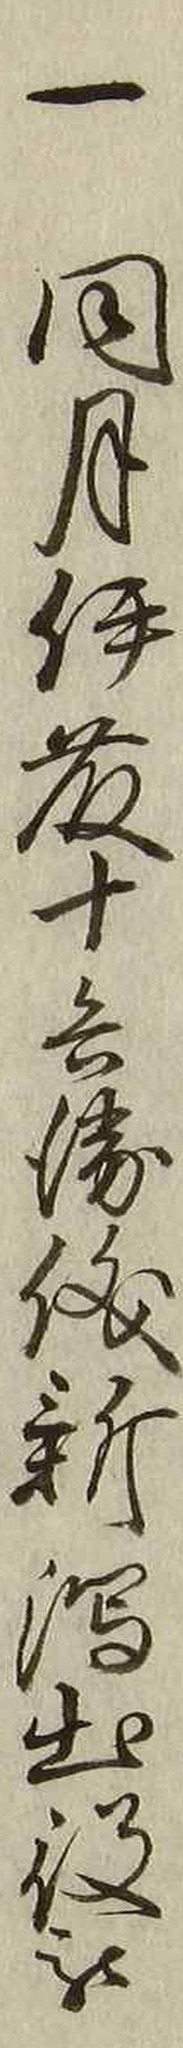一同月伊藤十兵衛儀新潟出役被
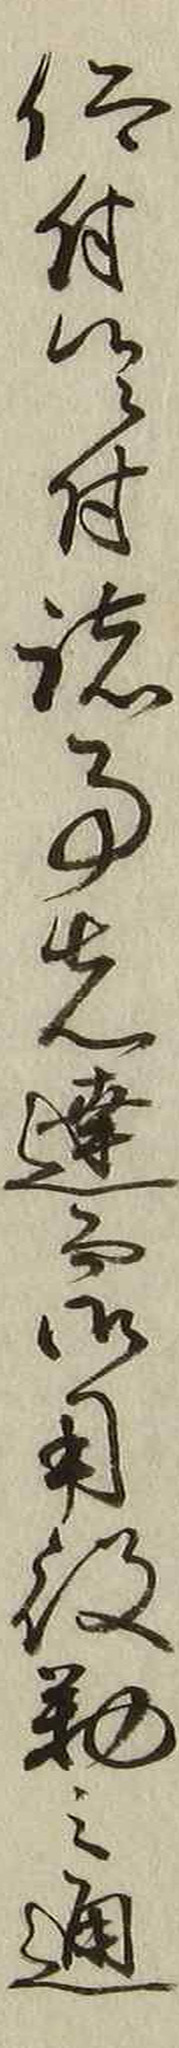仰付候ニ付諸事先達而御用役勤之通
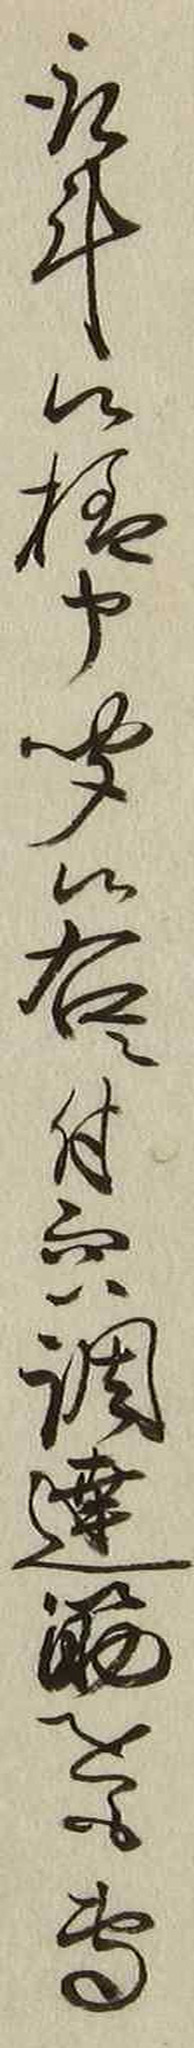取斗候様申聞候右ニ付而ハ調達筋をも専
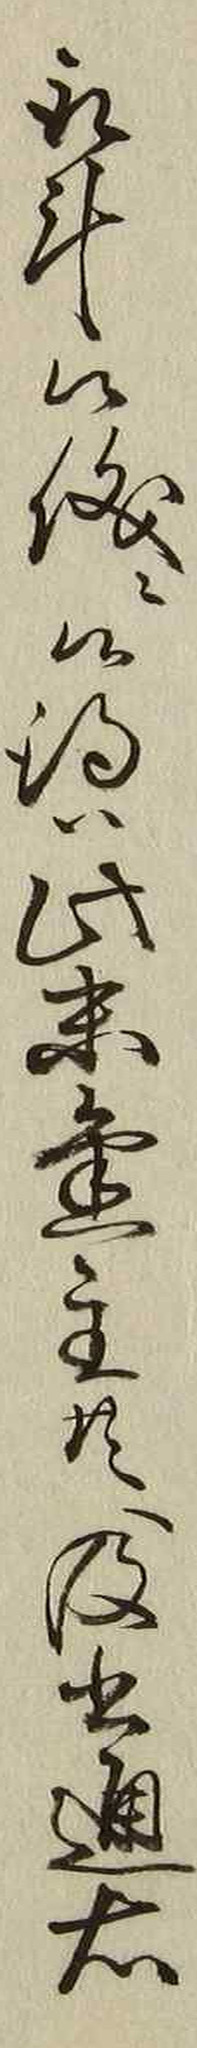取斗候儀侯ニ得ハ此末金主共へ及書通右
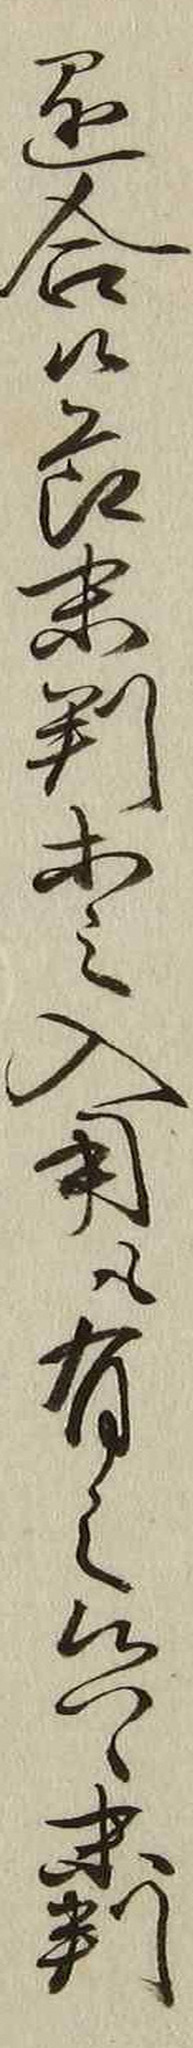懸合候節末判等之入用も有之候ハヽ末判
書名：諸士系譜　巻之21　い之部21
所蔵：会津若松市立会津図書館
